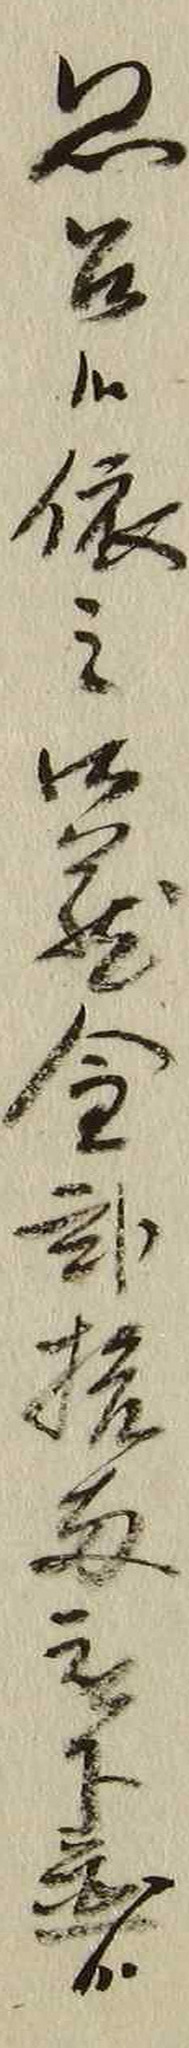思召候依之御蔵金弐拾両被下置候
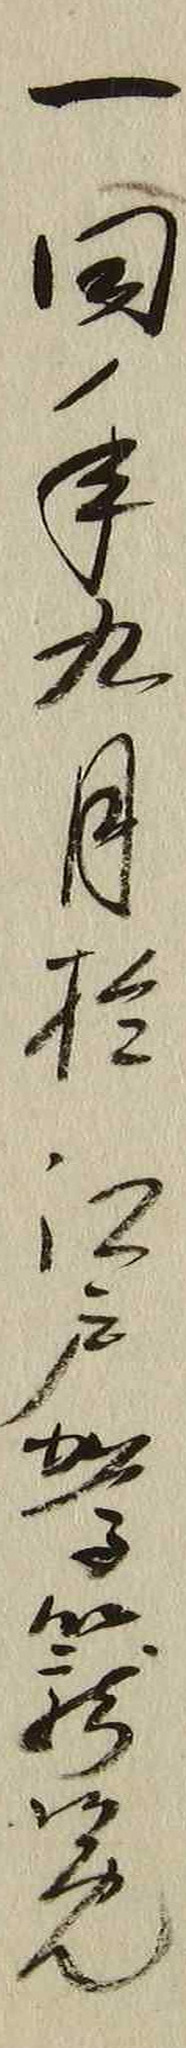一同年九月於江戸駕籠御免
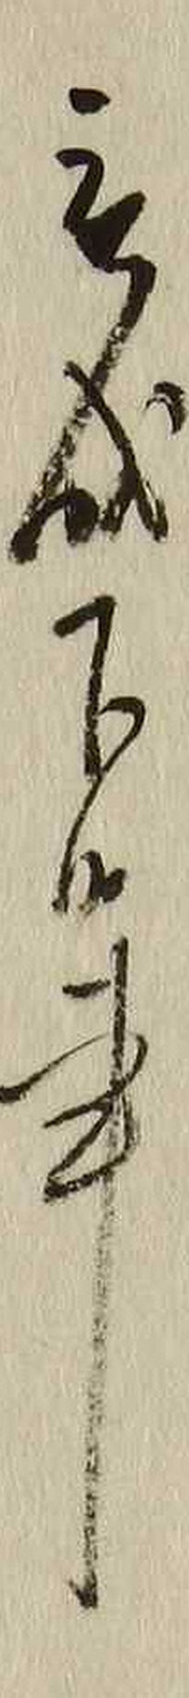被成下候事
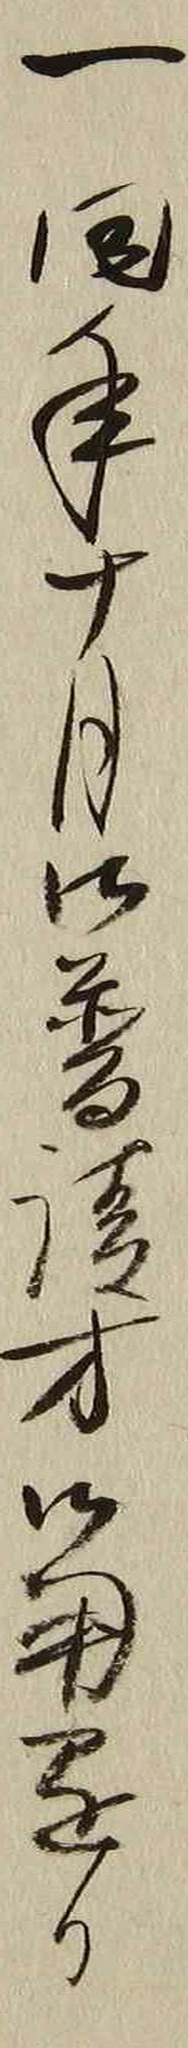一同年十月御普請方御用懸り
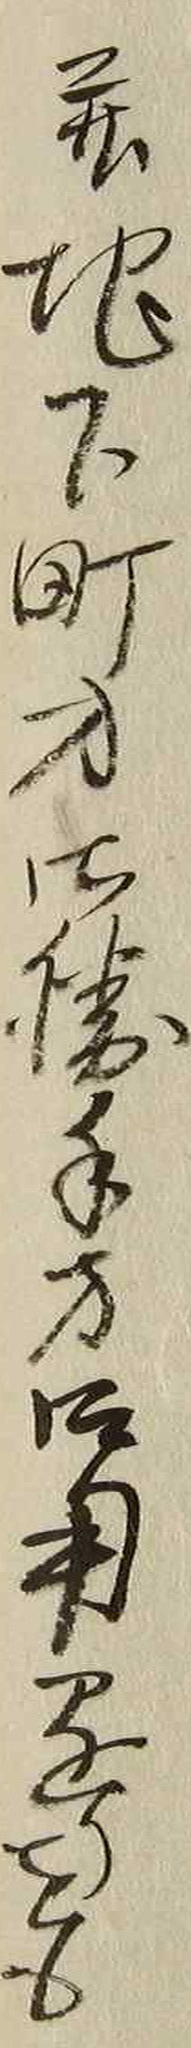并地下町方御勝手方御用懸りをも
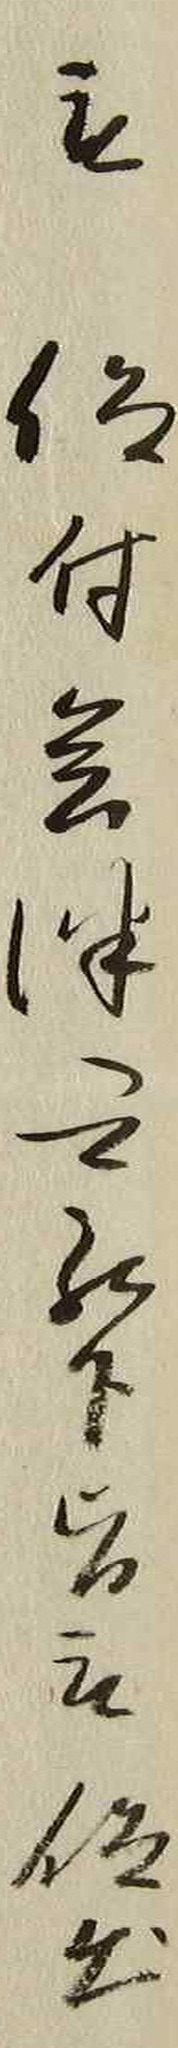被仰付会津へ可罷下旨被仰出
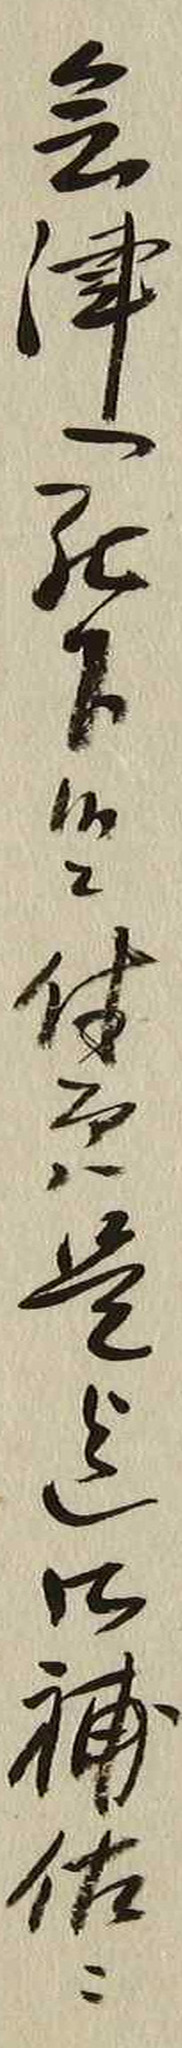会津へ罷下候ニ付而ハ是迄御補佐々
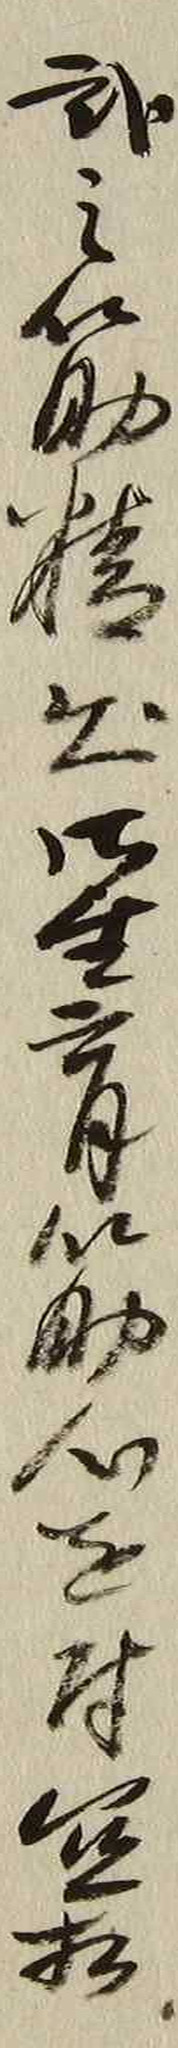弐之筋精出御生育筋心を付宜相
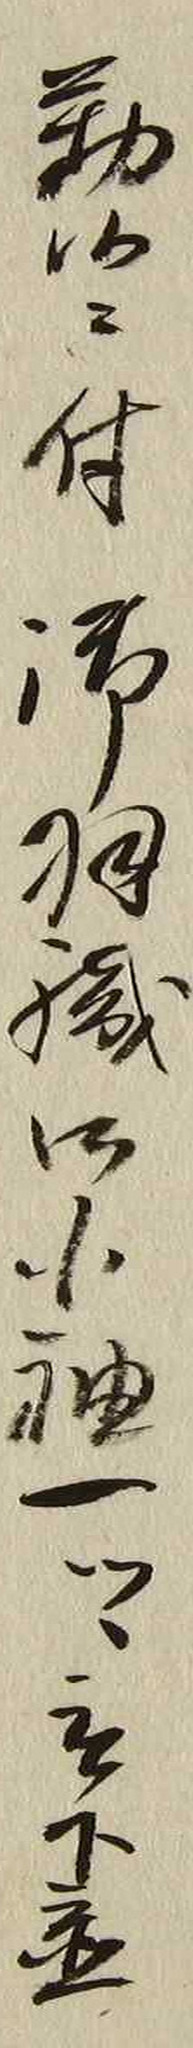勤候ニ付御羽織御小袖一ツヽ被下置
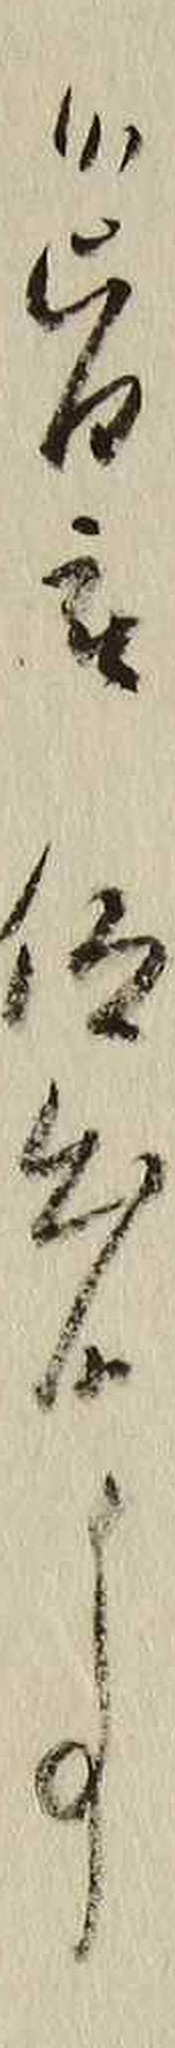候旨被仰出候事
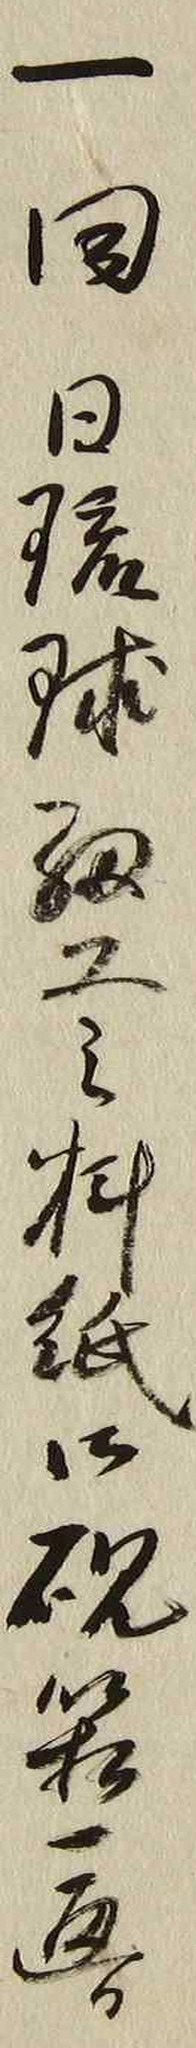一同日琉球細工之料紙御硯箱一通り
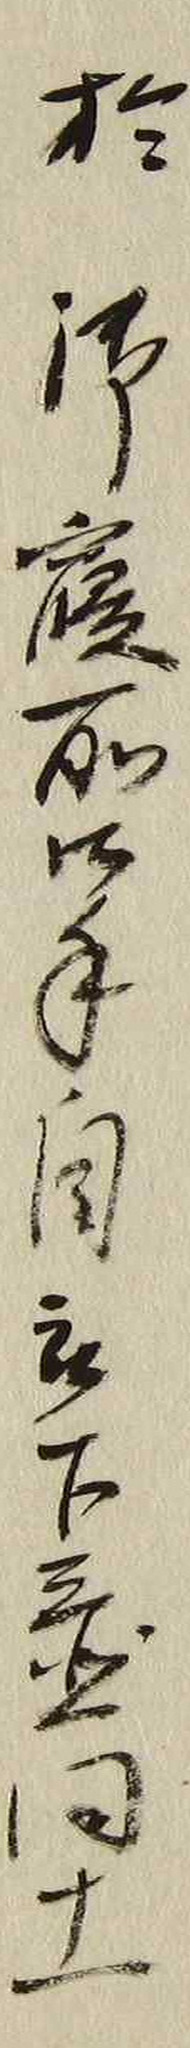於御寝所御手自被下置同十一
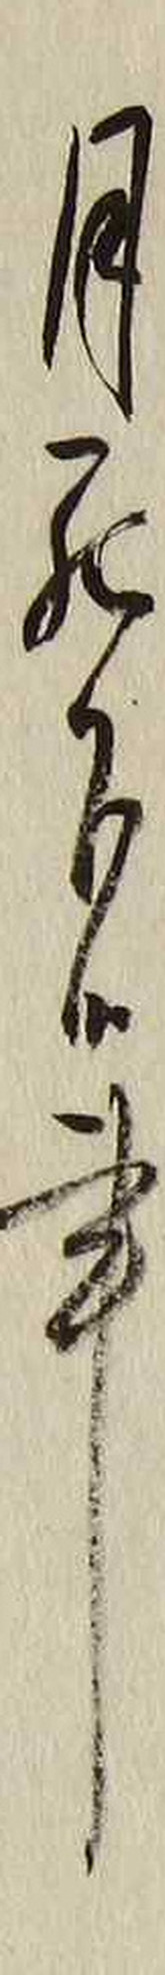月罷下候事
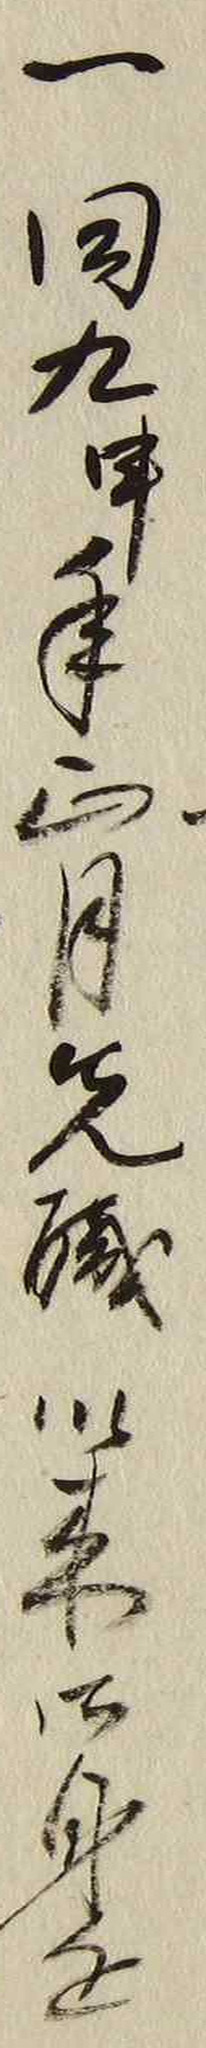一同九申年正月先職以来御身近
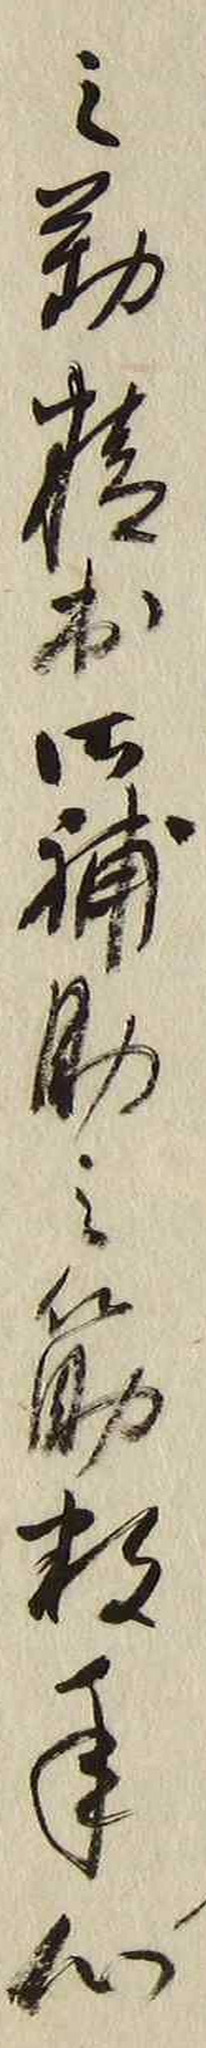之勤精出御補助之筋数年心

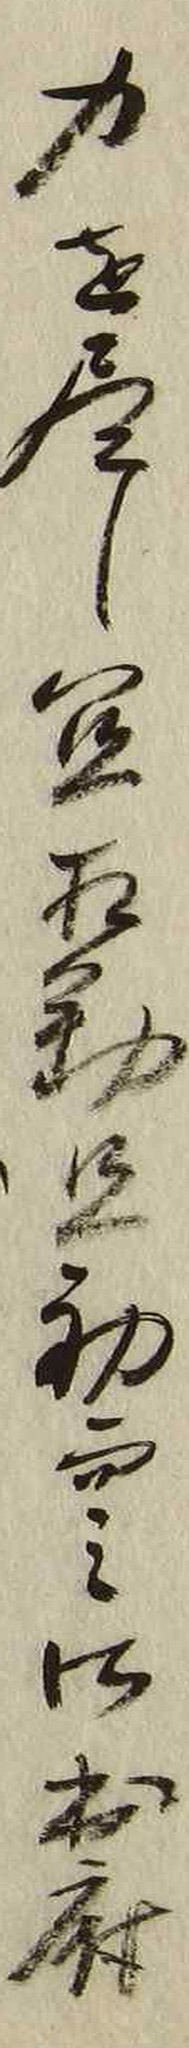力を尽し宜相勤且初而之御出府
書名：諸士系譜　巻之351　す之部1
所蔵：会津若松市立会津図書館
